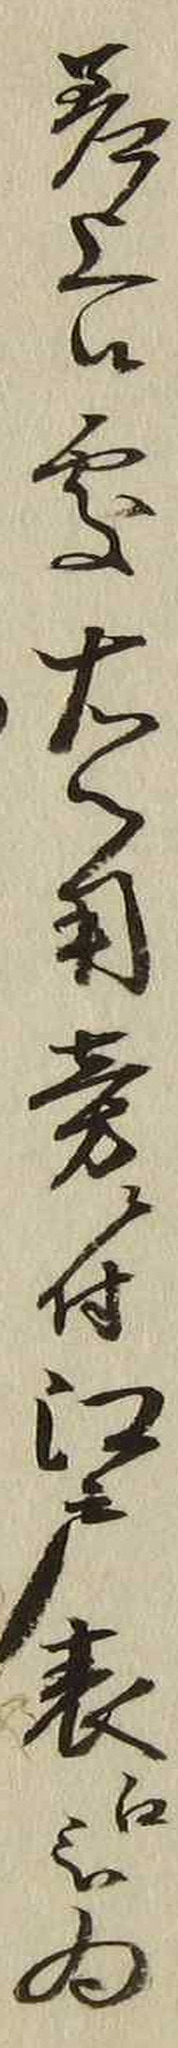差上候処右御用旁ニ付江戸表江被為
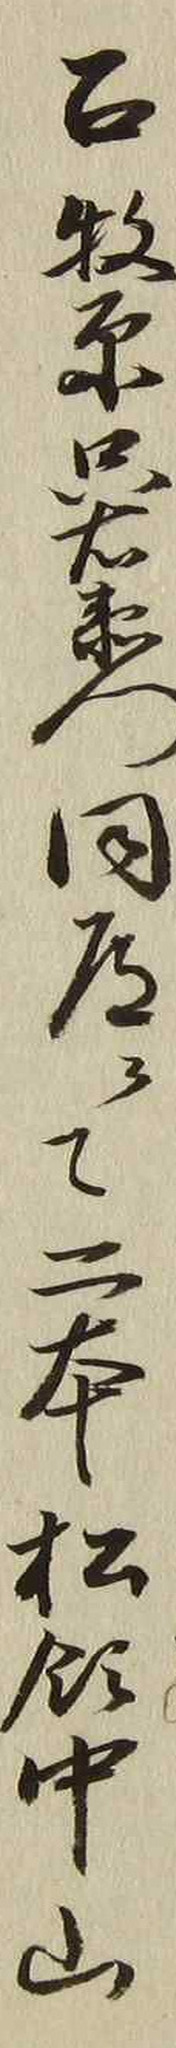召牧原只右衛門同道ニて二本松領中山
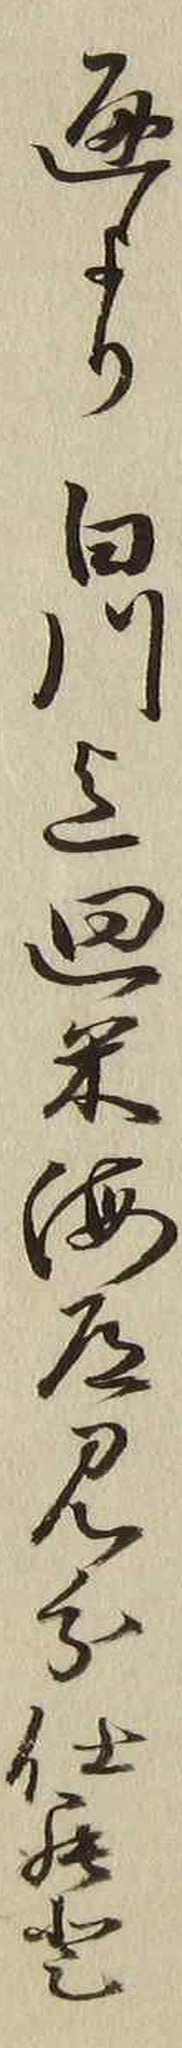通より白川迄廻米海道見分仕罷登
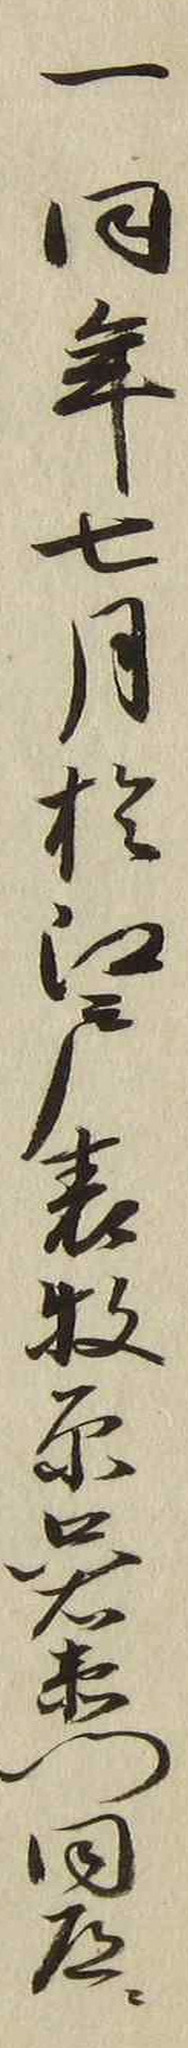一同年七月於江戸表牧原只右衛門同道ニ
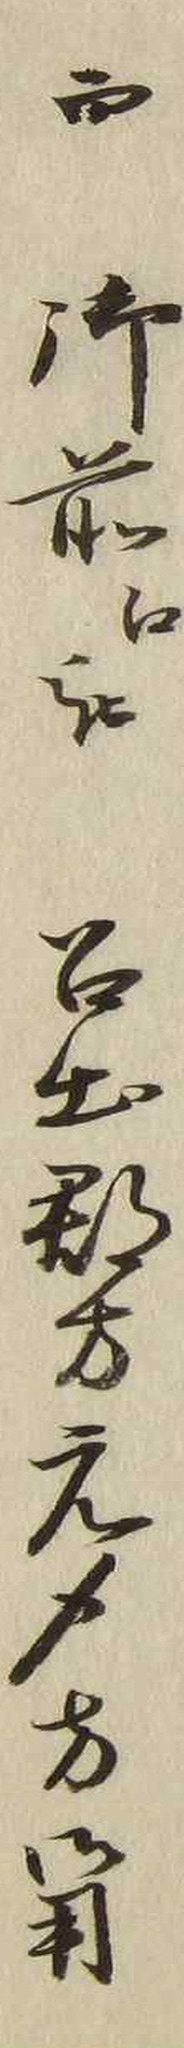而御前江被召出郡方元〆方御用

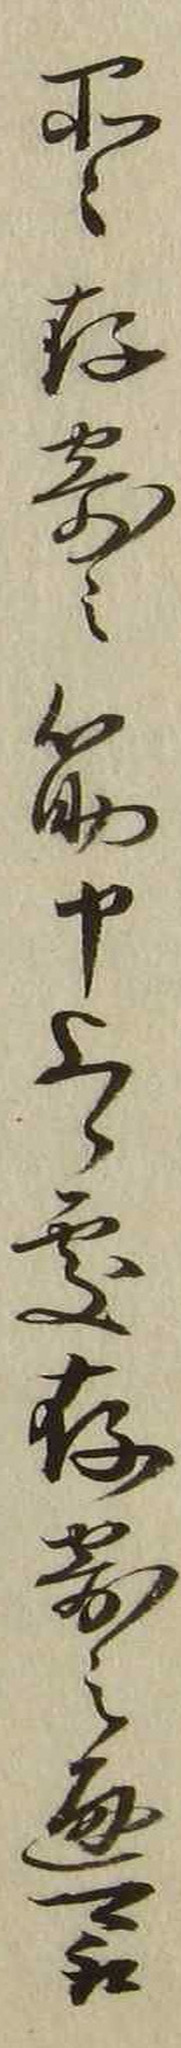品々存寄之筋申上候処存寄之通可被
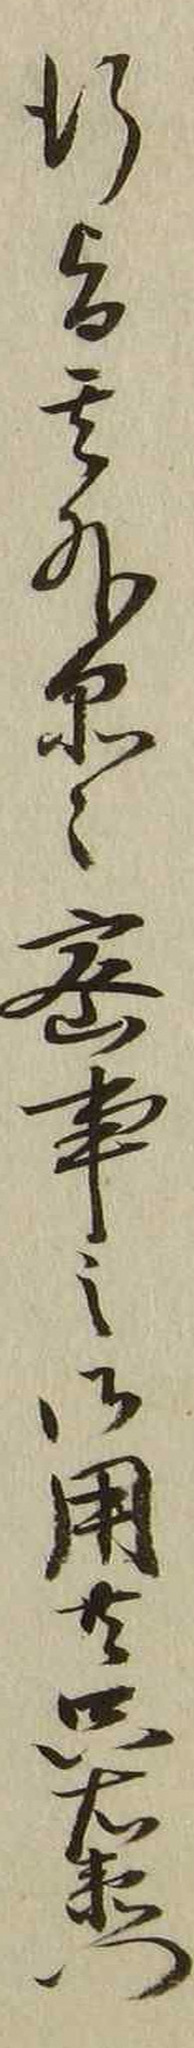行旨其外品々密事之御用共只右衛門
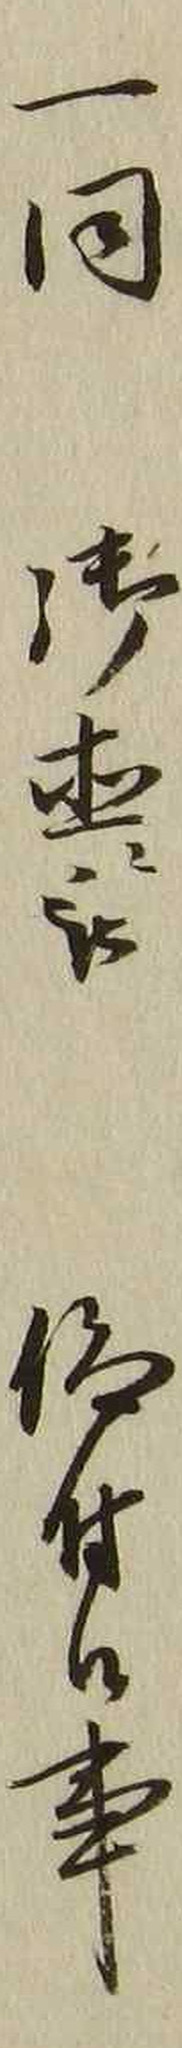一同御直ニ被仰付候事
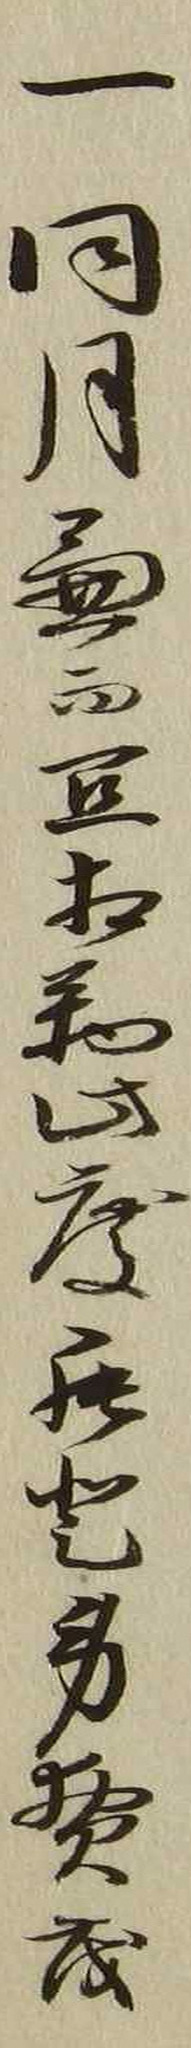一同月兼而宜相勤此度罷登労費も
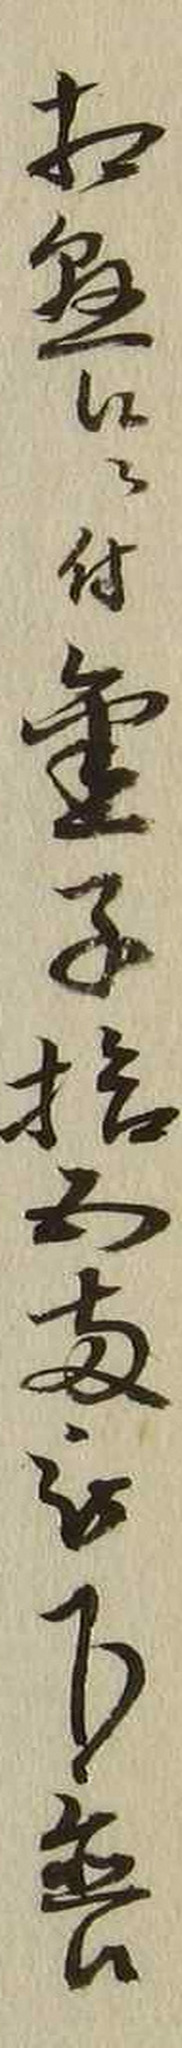相懸候ニ付金子拾五両被下置候
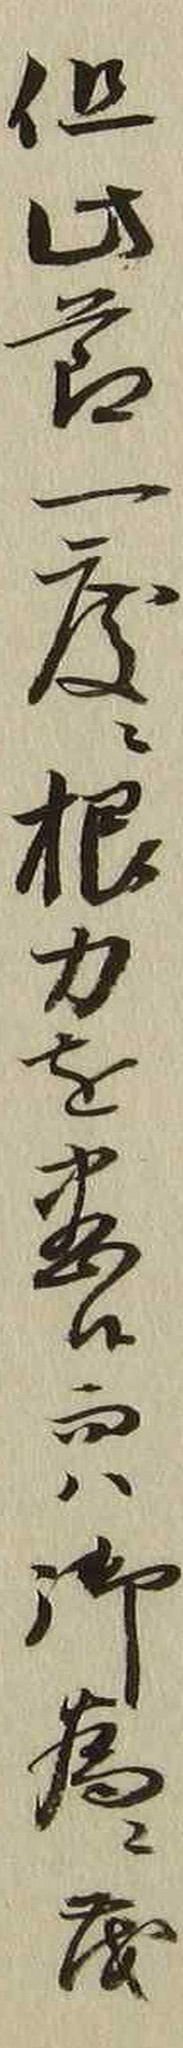但此節一度ニ根力を尽候而ハ御為ニも
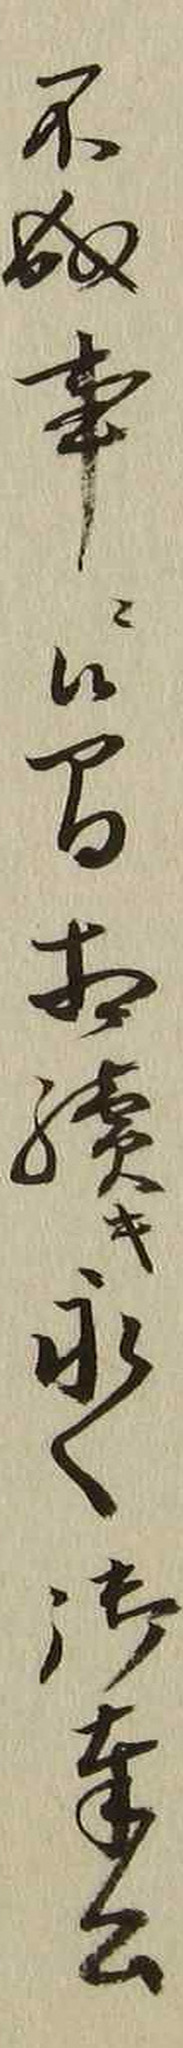不成事ニ候間相続キ永く御奉公
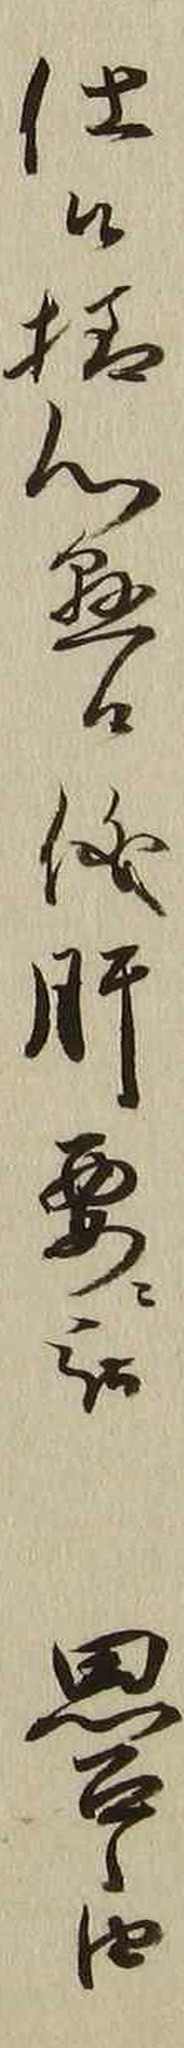仕候様心懸候儀肝要ニ被思召候由
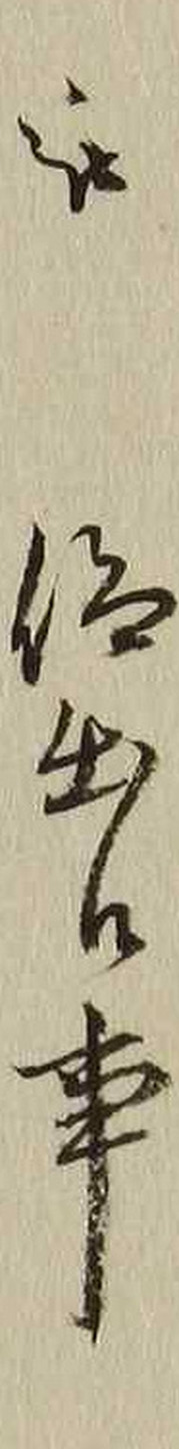被仰出候事
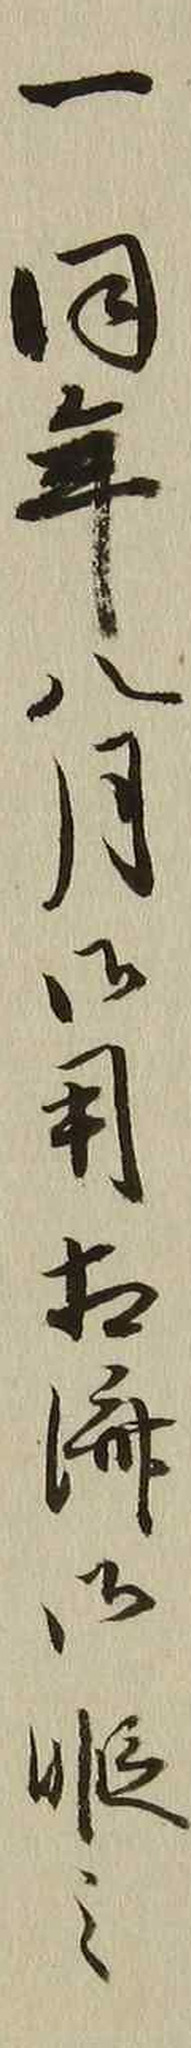一同年八月御用相済御暇之
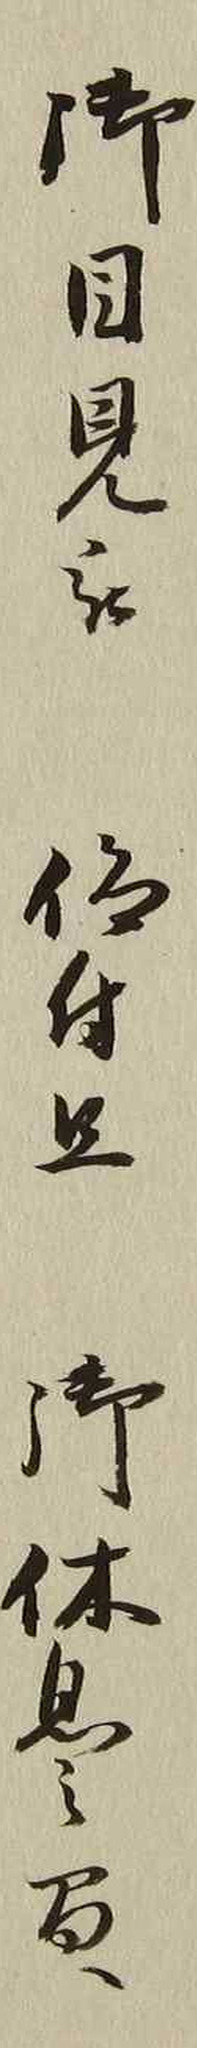御目見被仰付且御休息之間へ
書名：諸士系譜　巻之61　と之部4
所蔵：会津若松市立会津図書館
